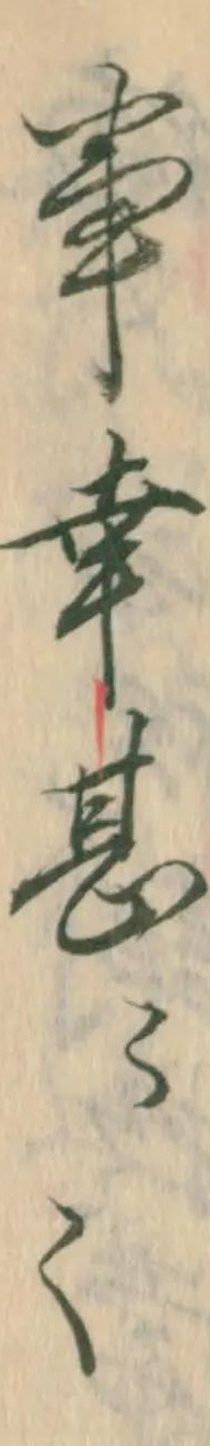事幸-甚々々

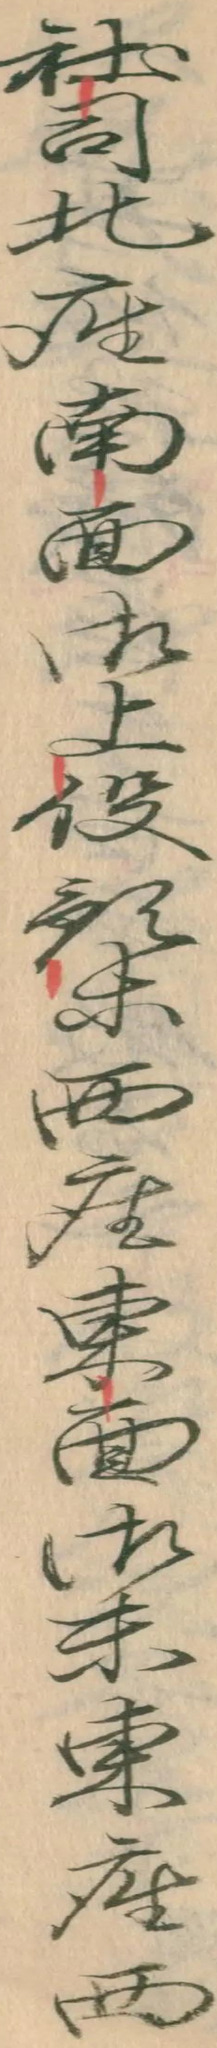社-司北座南-面御上_役預_等西座東-面御未東座西

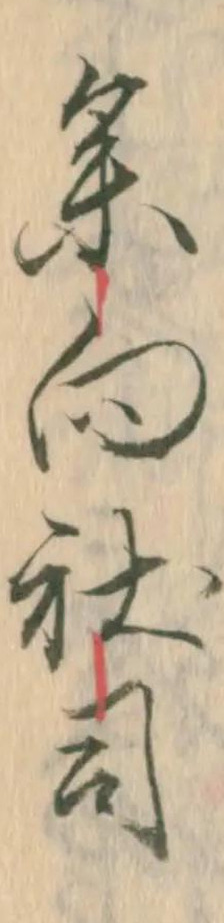参-向社-司
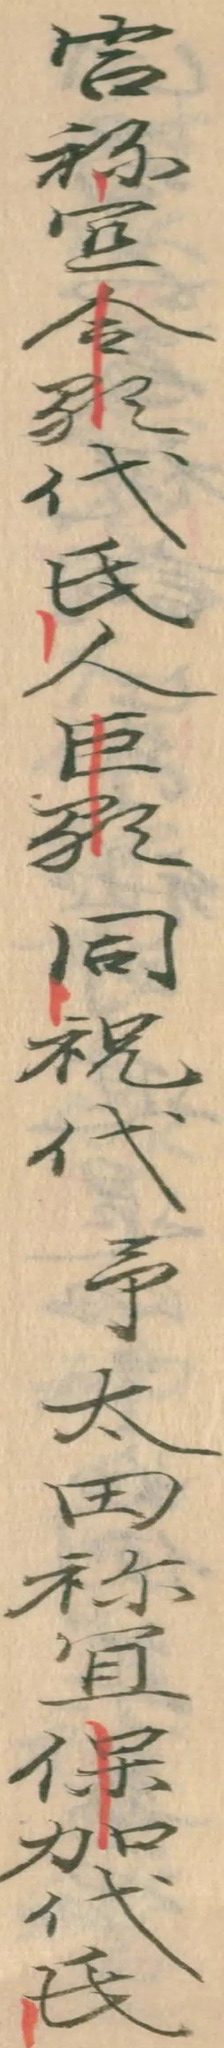宮祢-宜令顕代氏巨顕同_祝代予太田祢宜保加代氏_
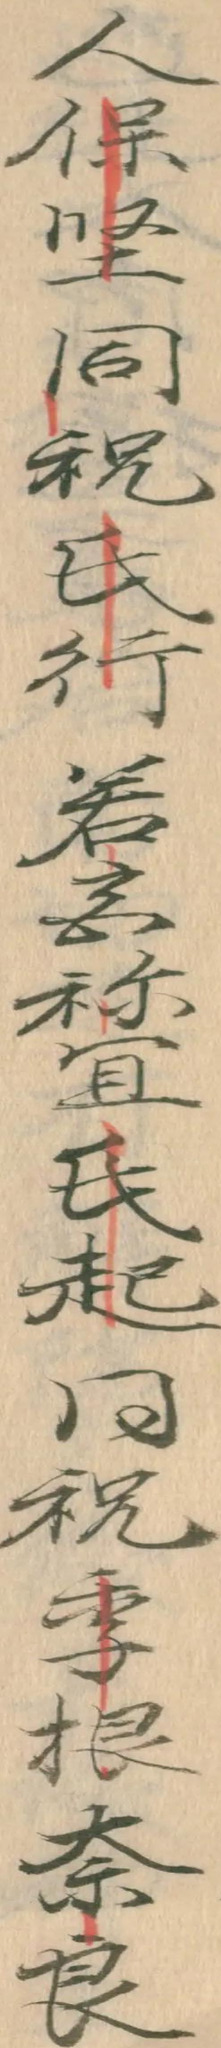人保堅同_祝氏行若-宮祢-宜氏起同祝季根奈-良
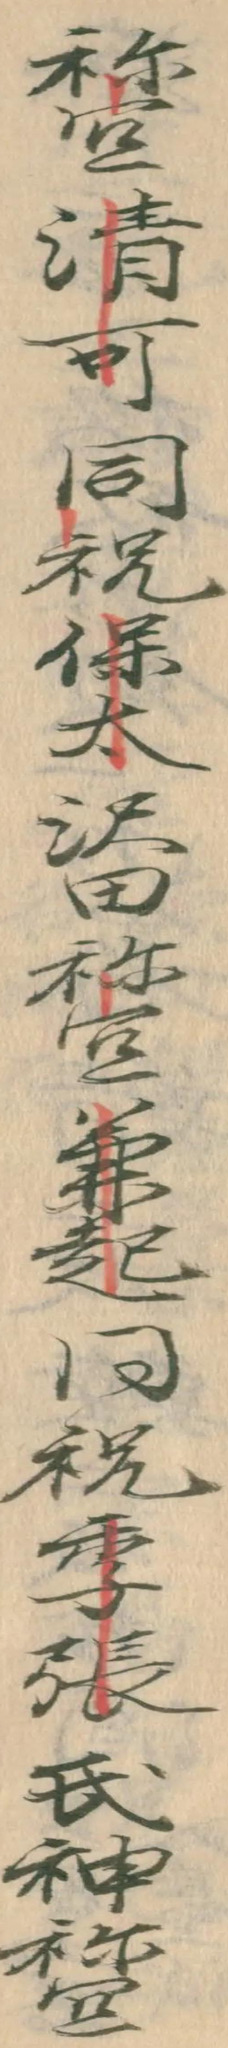祢-宜清可同_祝保太沢田祢-宜兼起同祝季張氏神祢宜
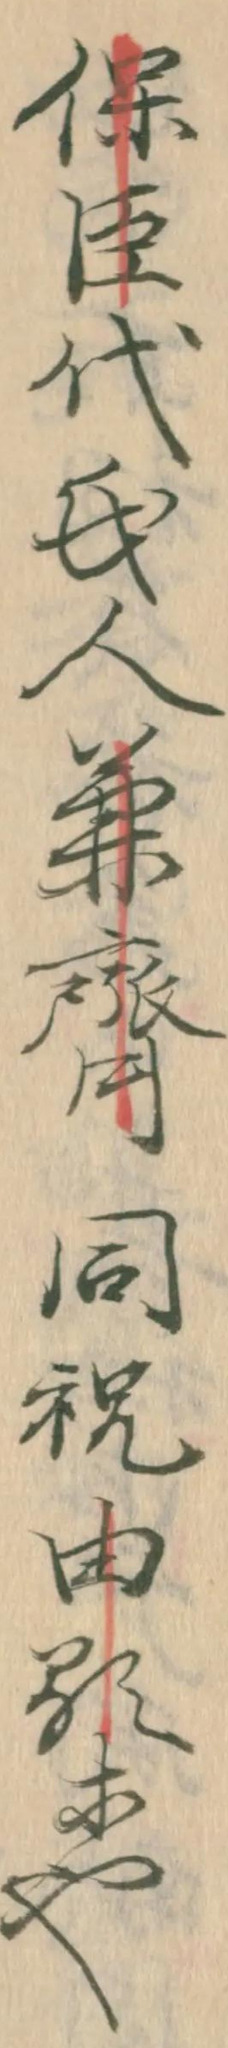保臣代氏人兼斉同祝由顕等也
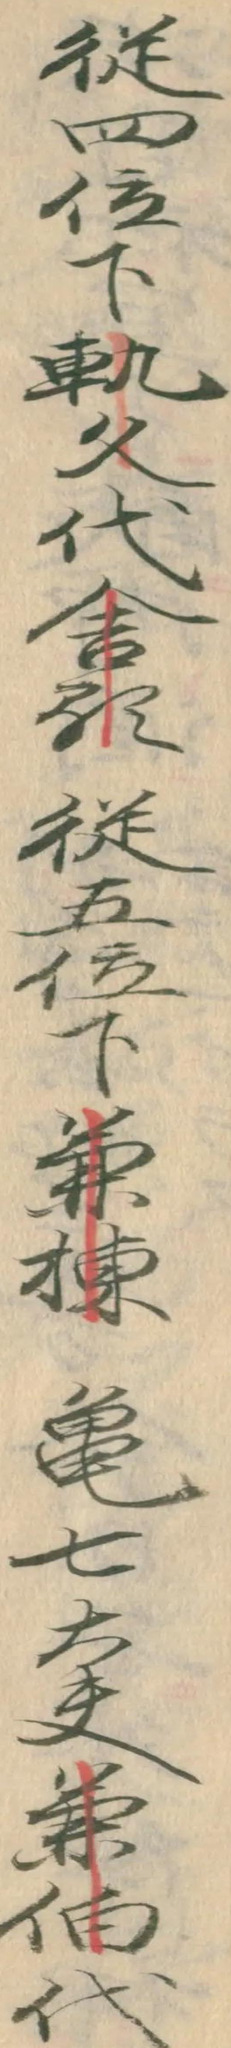従四位下軌久代舎顕従五位下兼棟亀七大夫兼伯代
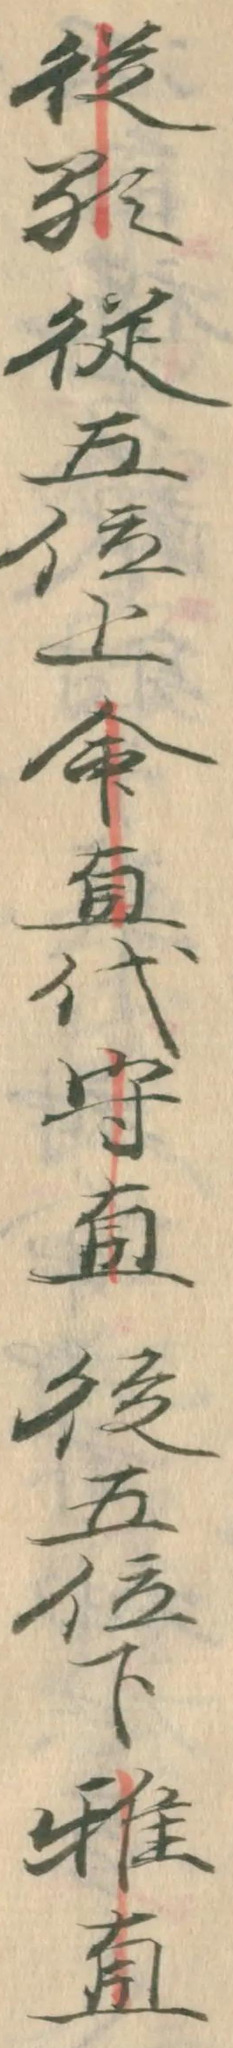従顕従五位上命直代守直従五位下雅直

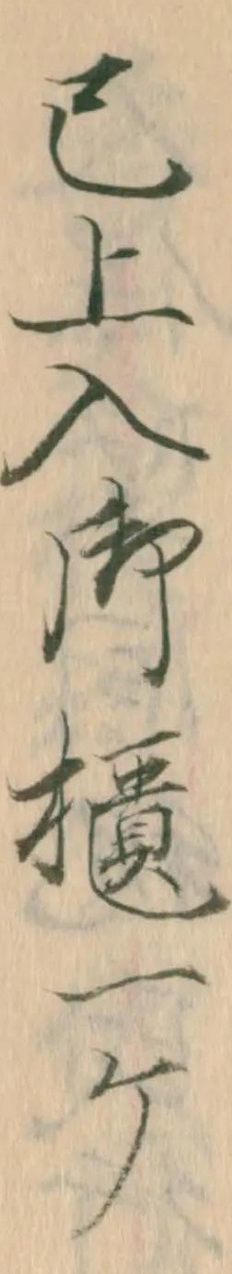已上入御櫃一ケ
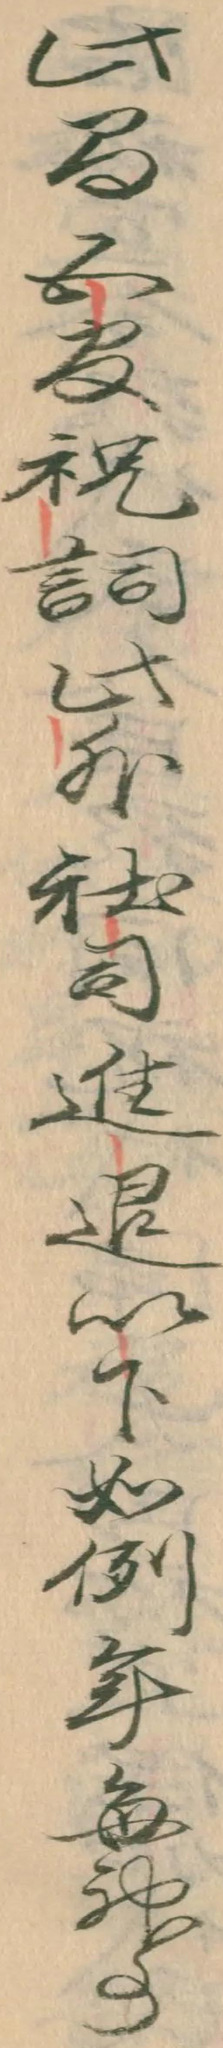此間五-官祝_詞此_外社-司進-退以-下如例年毎神事
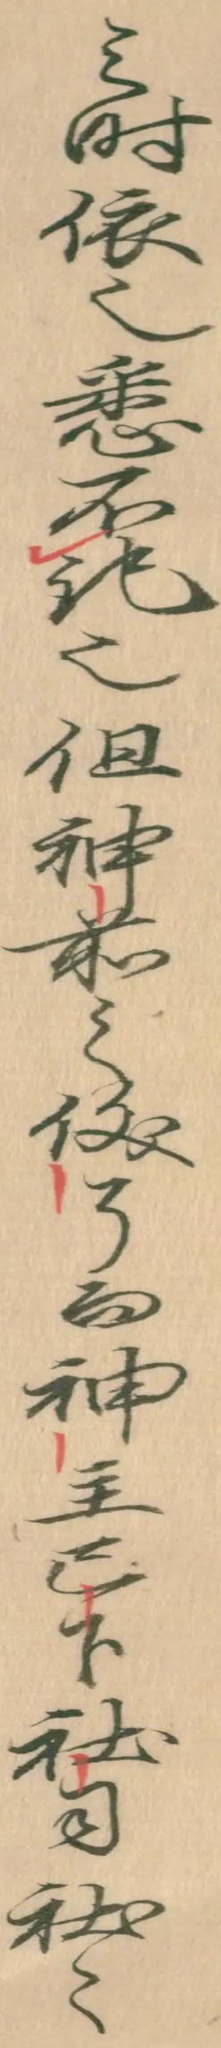之時依也悉不記也但神-前之儀_了而神_主已-下社-司社々

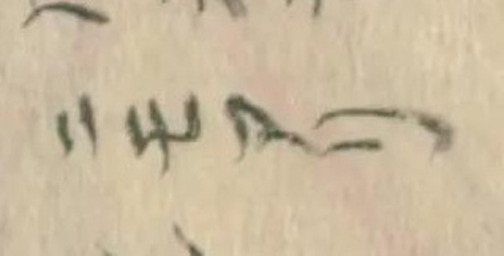ニモアリ
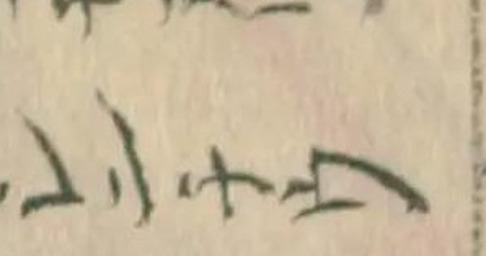シンチウ
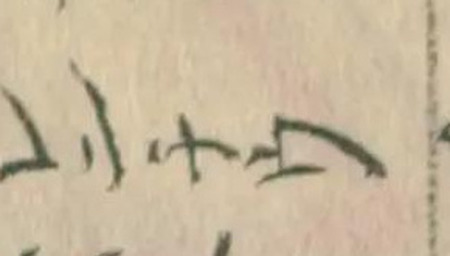シンチウ
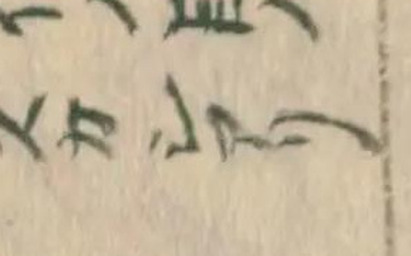スカシアリ
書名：賀茂社記録. 第15冊
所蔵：国立国会図書館 National Diet Library, JAPAN
